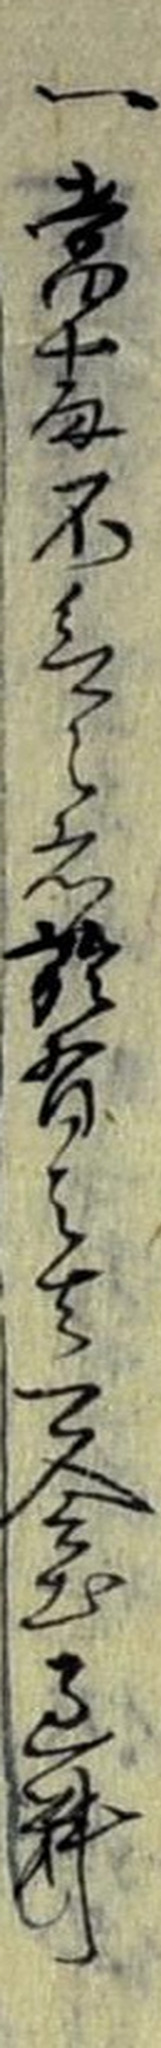一当番不参之者於有之者可会出過料
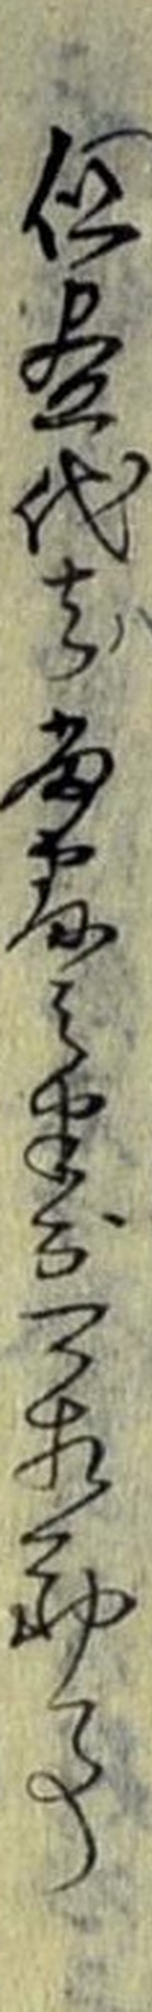但昼代者当番之半分可相勤事
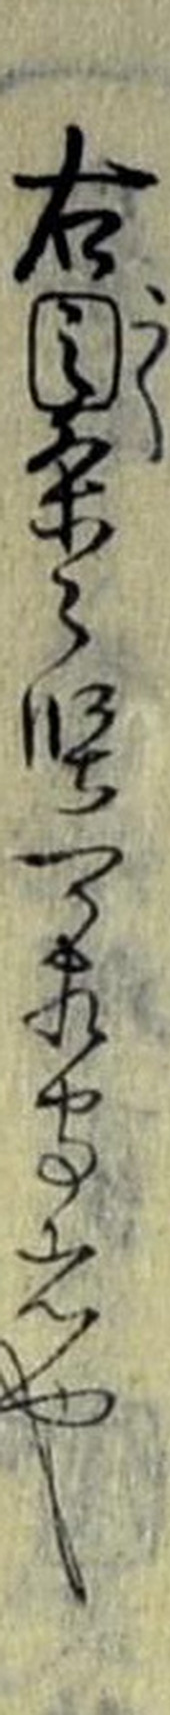右之条々堅可相守者也
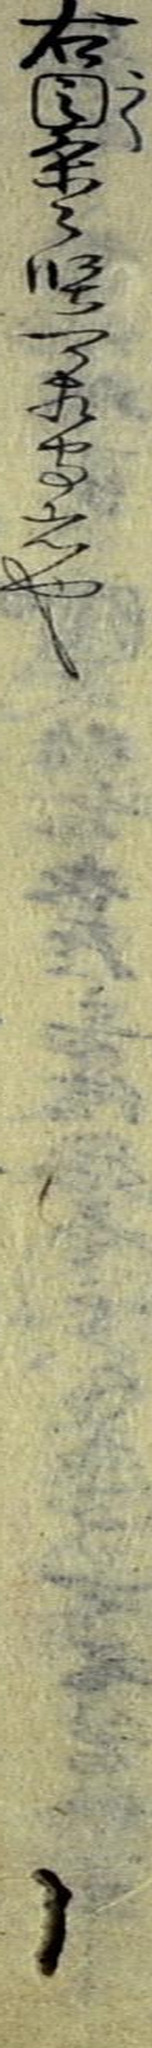右之条々堅可相守者也
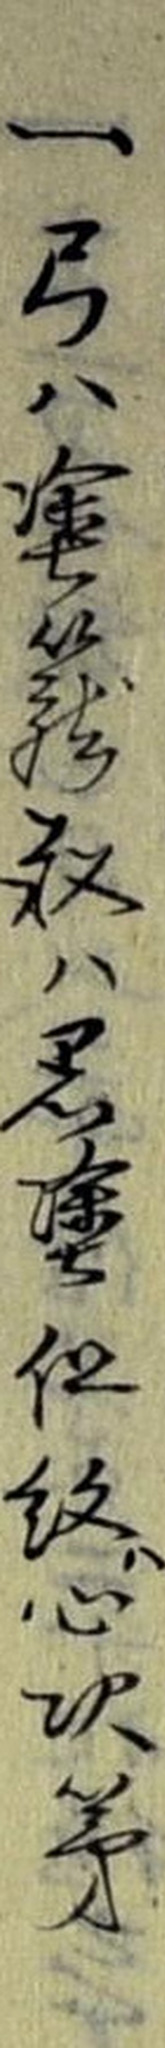一弓ハ塗籠靭ハ黒塗但紋ハ心次第
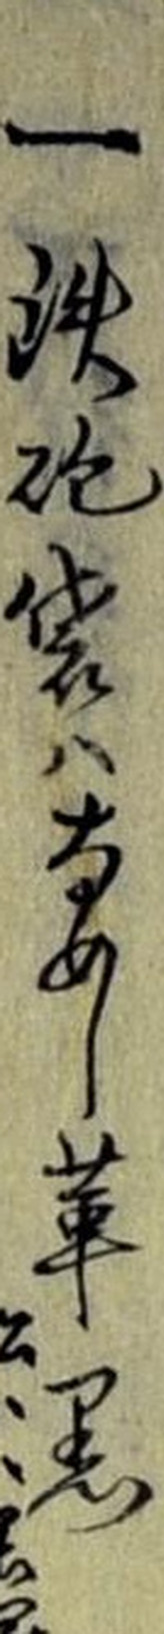一鉄炮袋ハなめし革黒
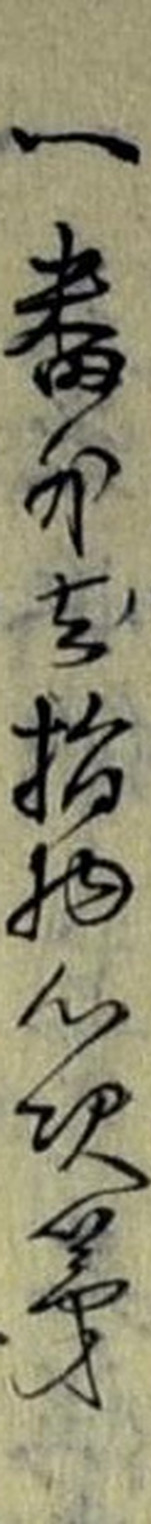一番外者指物心次第
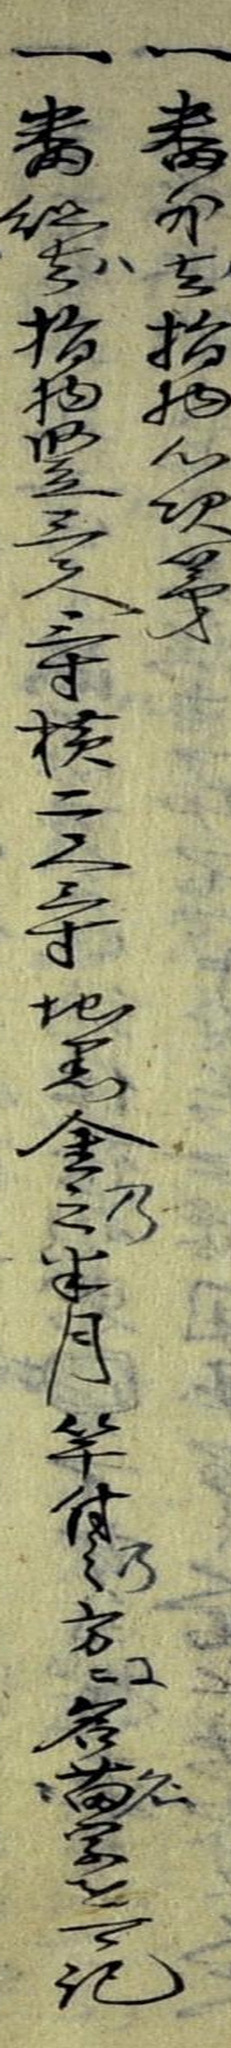一番組者指物竪三尺三寸横二尺三寸地黒金之半月竿付之方ニ名苗字を可記
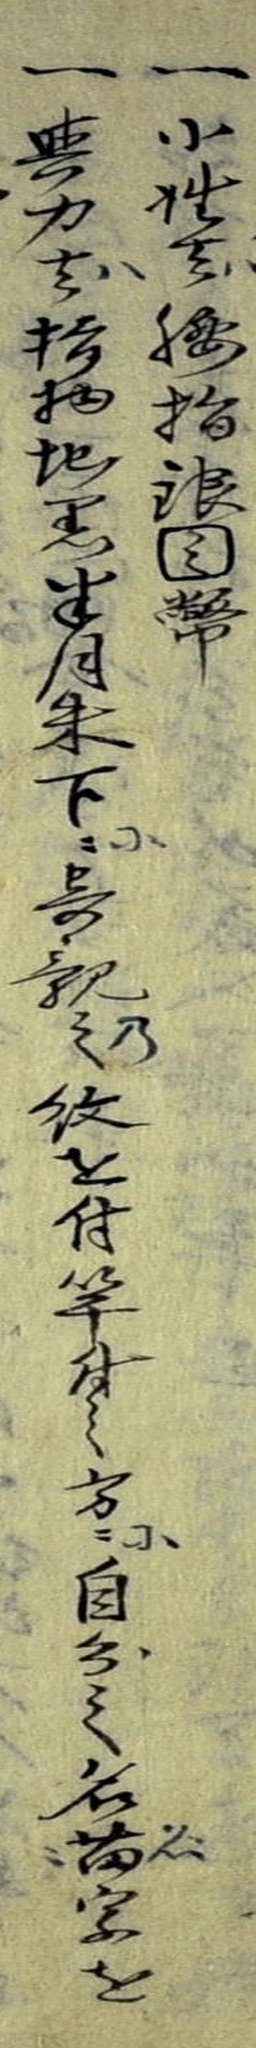一与力者指物地黒半月朱下ニ寄親之紋を付竿付之方ニ自分之名苗字を
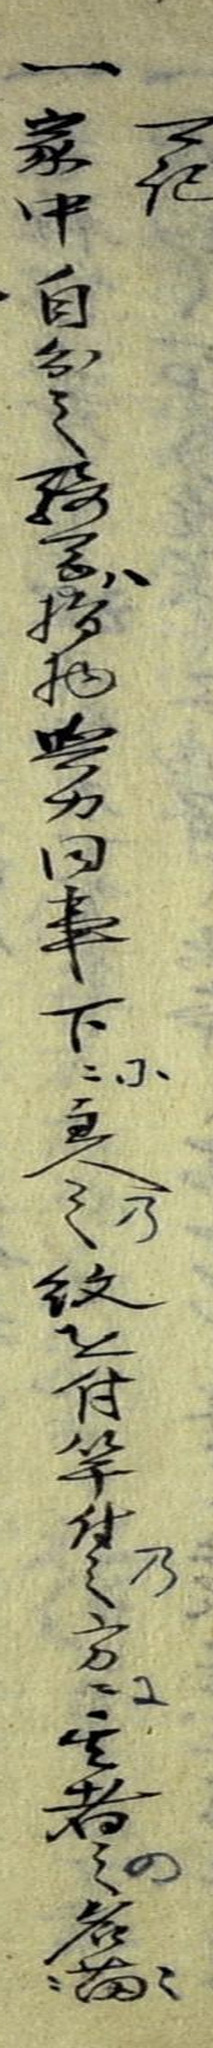一家中自分之騎馬◦ハ指物与力同事下ニ主人之紋を付竿付之方ニ其者之名苗
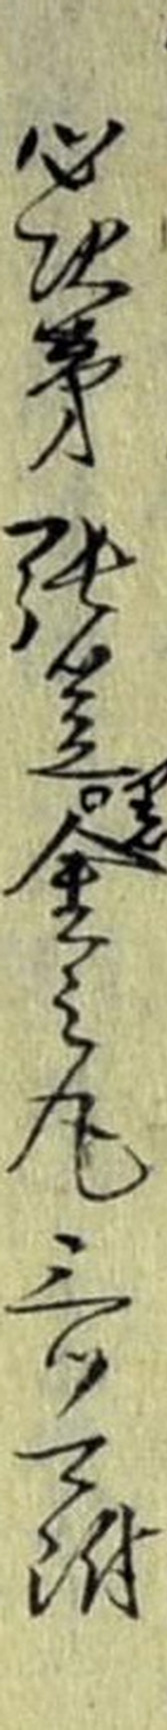心次第張笠◦黒金之丸三ツ可附
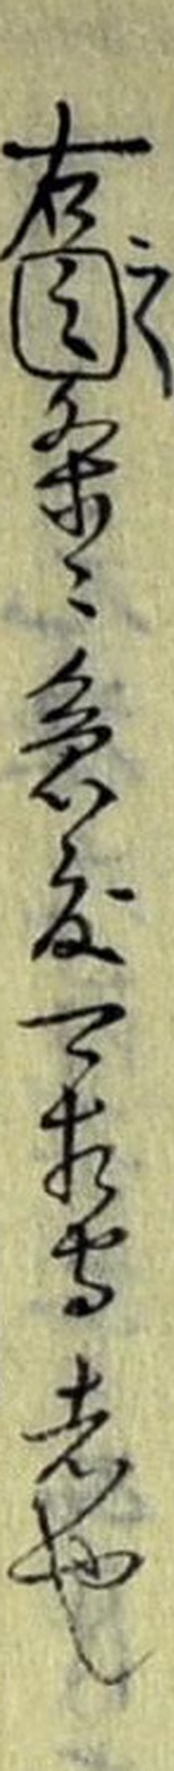右之条々急度可相守者也

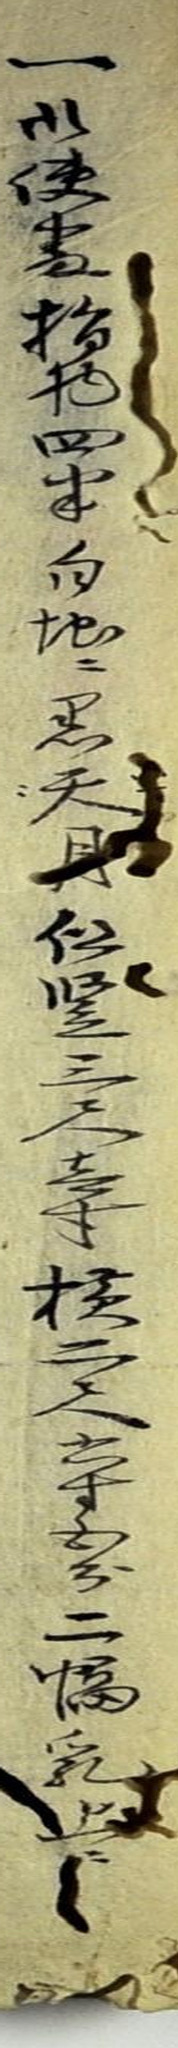一御使番指物四半白地ニ黒天月但竪三尺壱寸横二尺六寸五分二幅乳上ニ
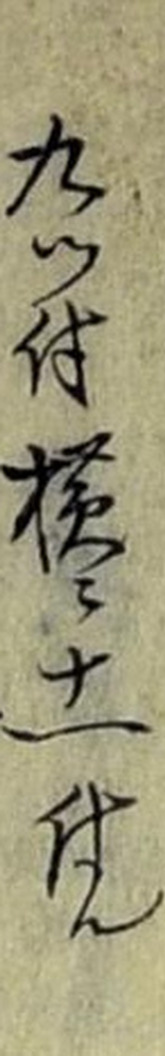九ツ付横ニ十一付ル
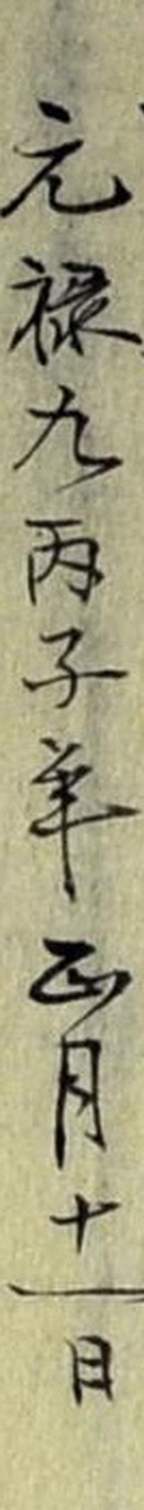元禄九丙子年正月十一日
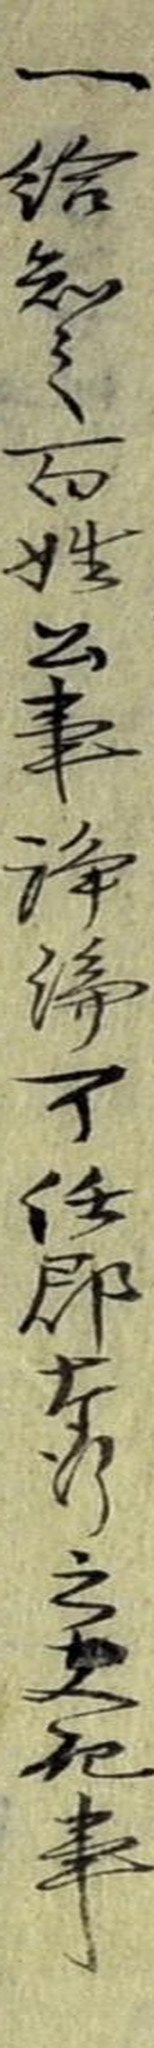一給地之百姓公事諍論可任郡奉行之支配事
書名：命令之部 一
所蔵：福井県文書館 Fukui Prefectural Archives
